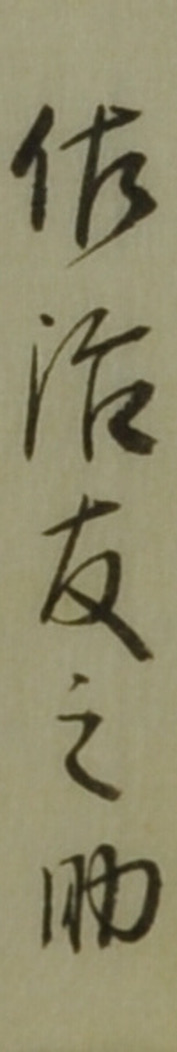佐治友之助
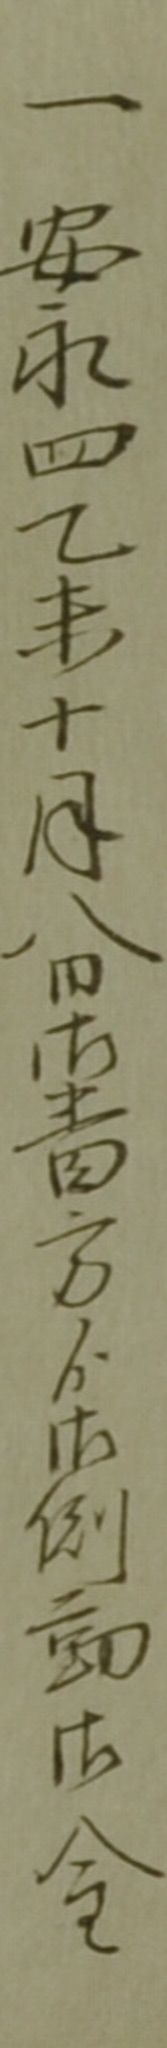一安永四乙未十月八日御番方ゟ御側勤御金
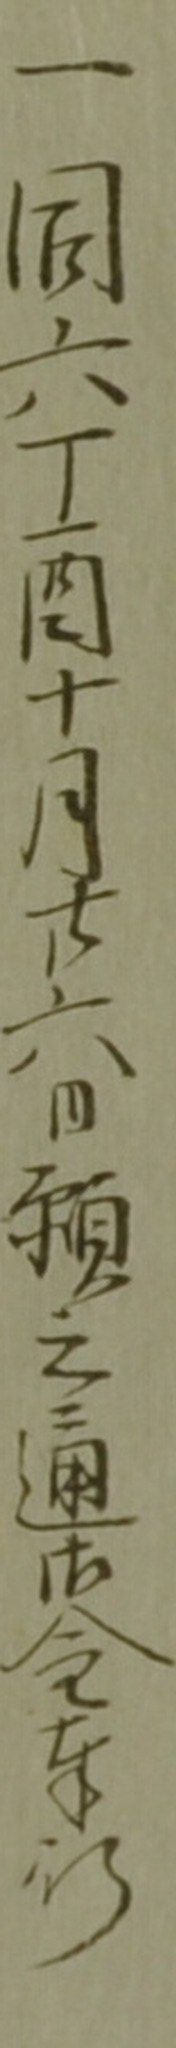一同六丁酉十月廿六日願之通御金奉行
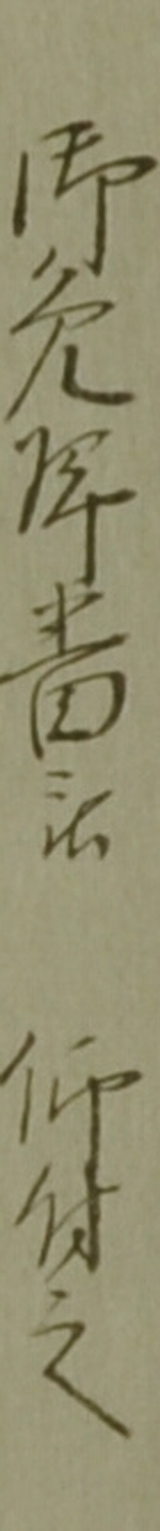御免帰番被仰付之
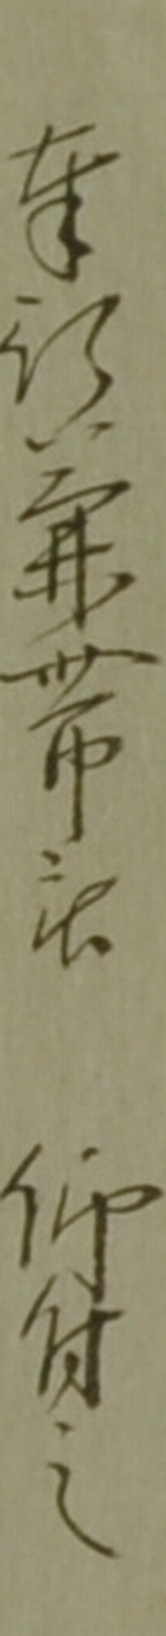奉行兼帯被仰付之
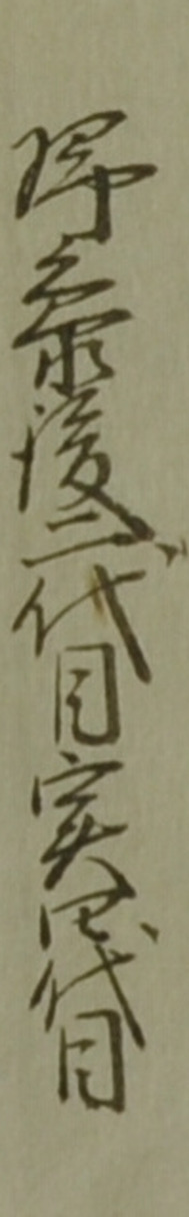帰参後二代目実四代目
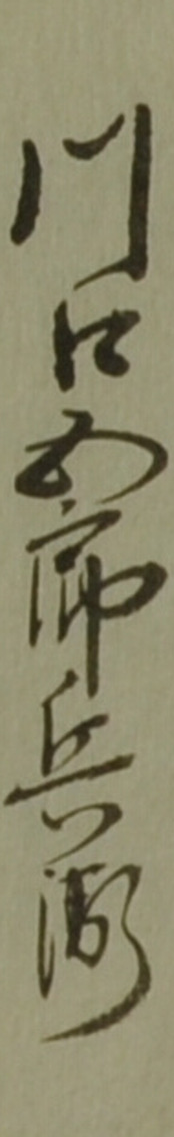川口五郎兵衛
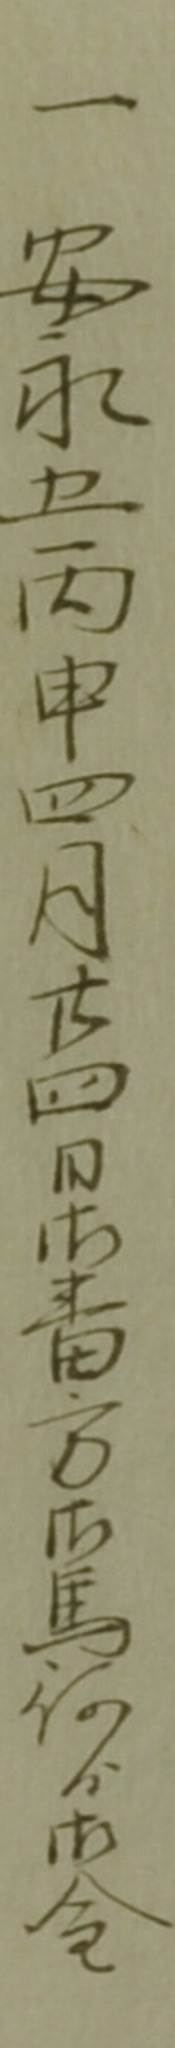一安永五丙申四月廿四日御番方御馬何ゟ御金
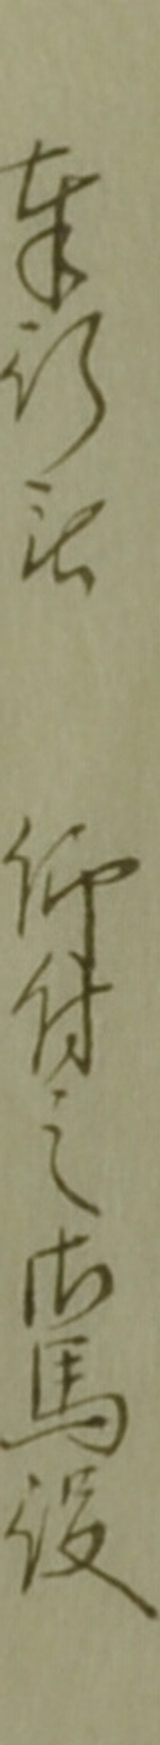奉行被仰付之御馬役
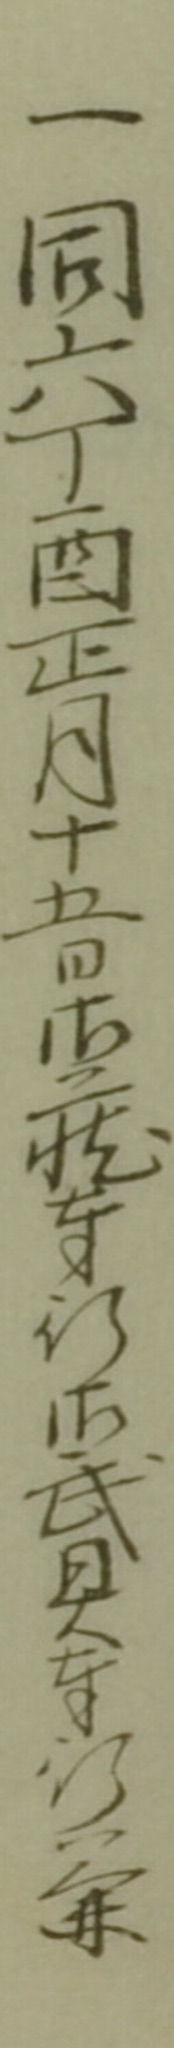一同六丁酉正月十五日御蔵奉行御武具奉行兼
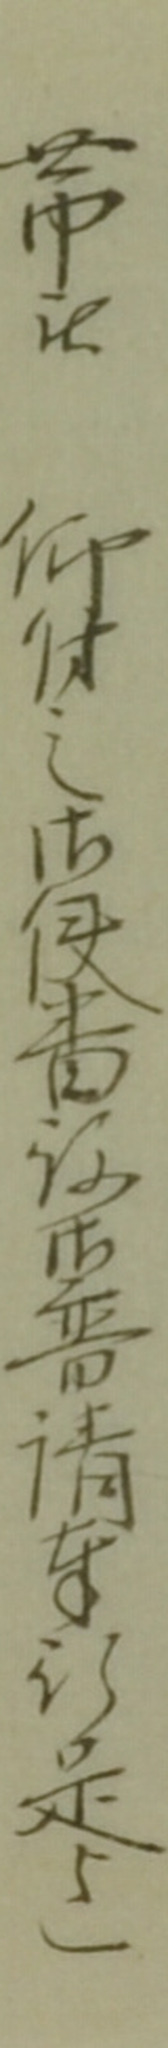帯被仰付之御使番役御普請奉行是迄
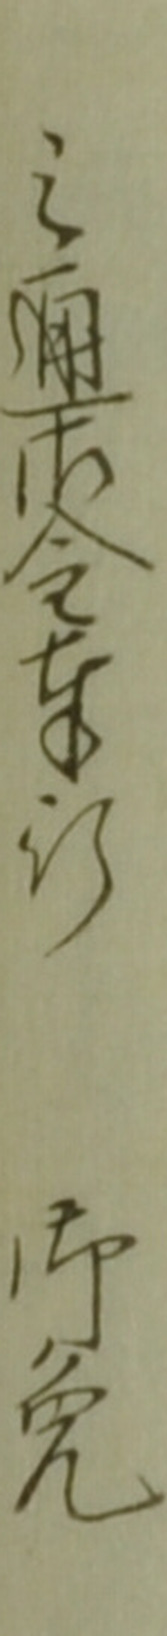之通御金奉行御免
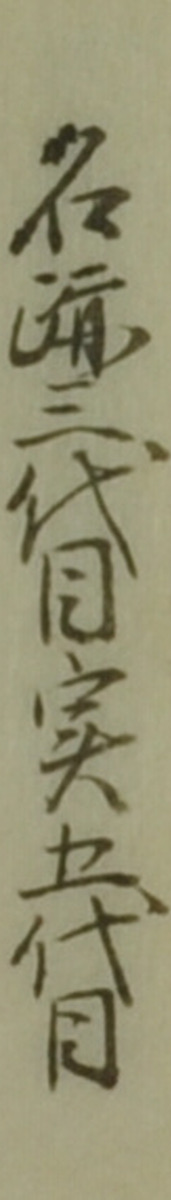名跡三代目実五代目
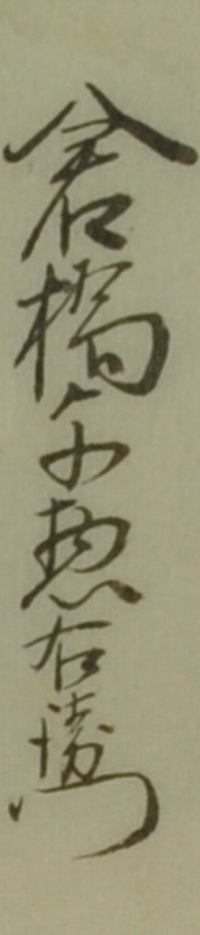倉橋与惣右衛門
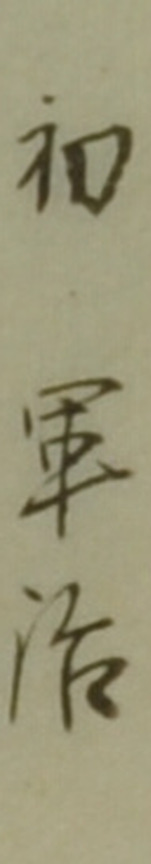初軍治
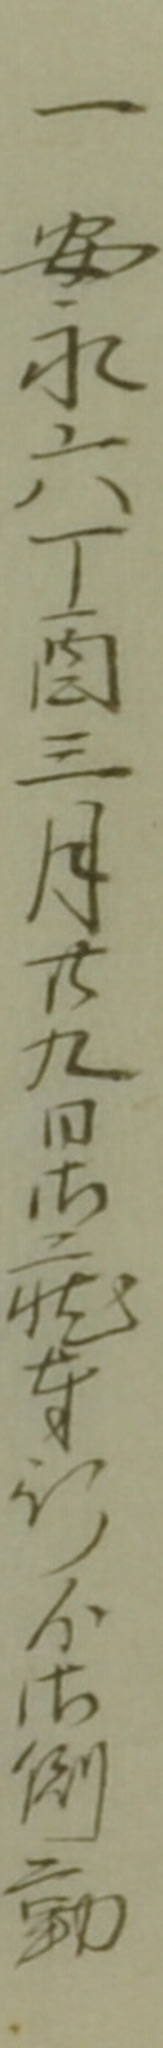一安永六丁酉三月廿九日御蔵奉行ゟ御側勤
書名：諸御役代々録（七）
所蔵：伊那市立高遠町図書館・合同会社AMANE
